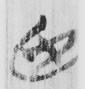臣
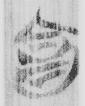合
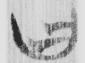曰
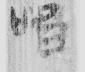唯
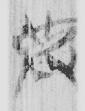皮
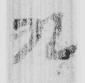九
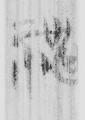神
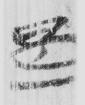是
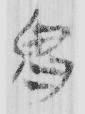胃
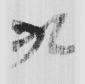九
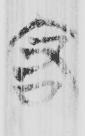宏
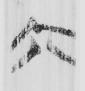六
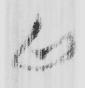㠯（以）
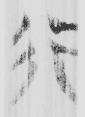行
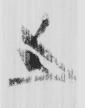之
